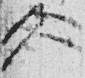大
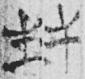牲
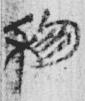利
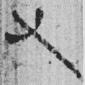又
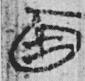卣（攸）
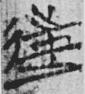往
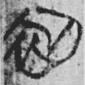初
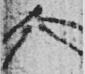六
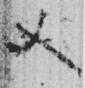又（有）
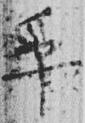孚
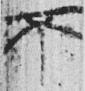不
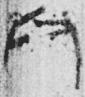夂（終）
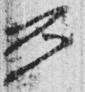乃
